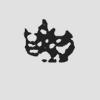𡄹
